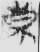東
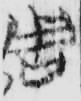周
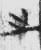之
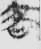客
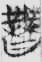○（許）
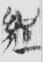○（盈）
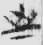至
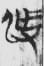{尸拃}（胙）
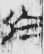於
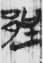郢
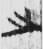之
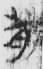歲（歲）
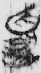○（夏）
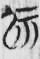𫵖
